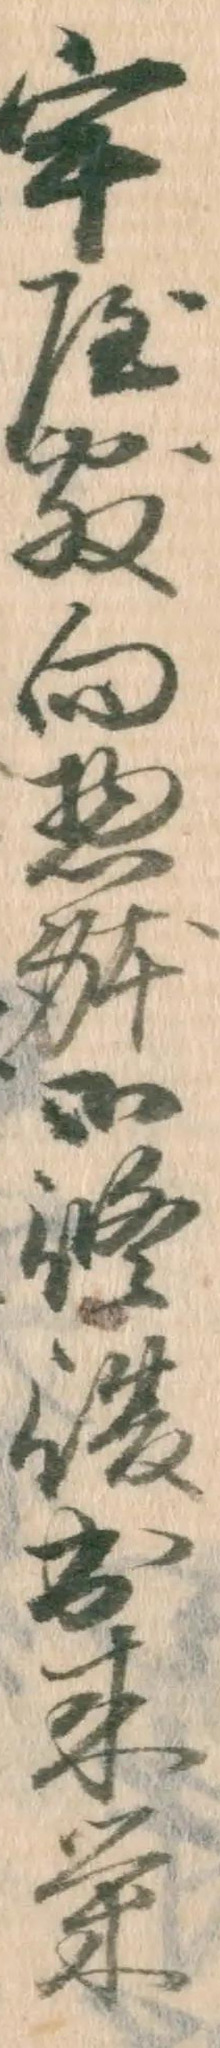│牢屋敷向惣体御修復出来栄
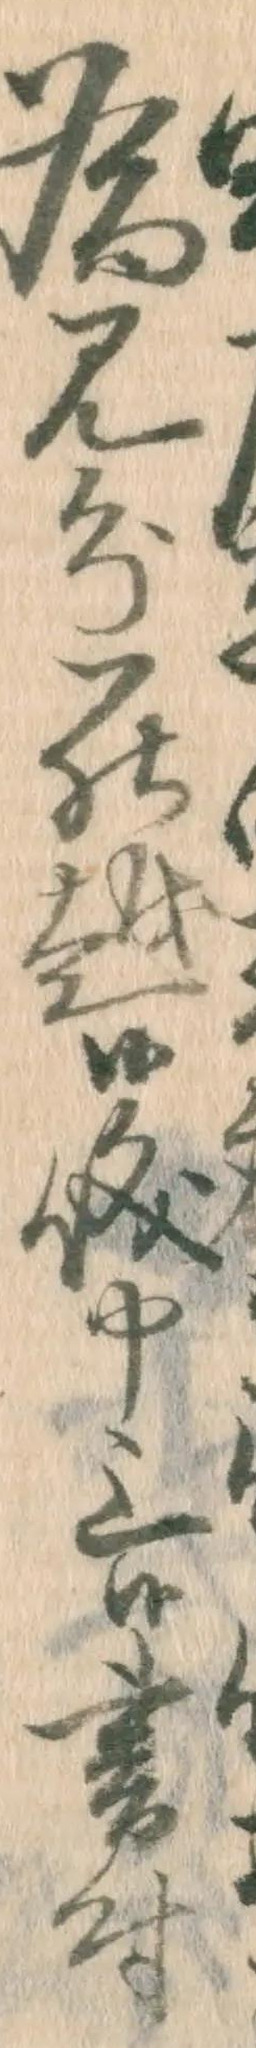│為見分罷越候儀申上候書付
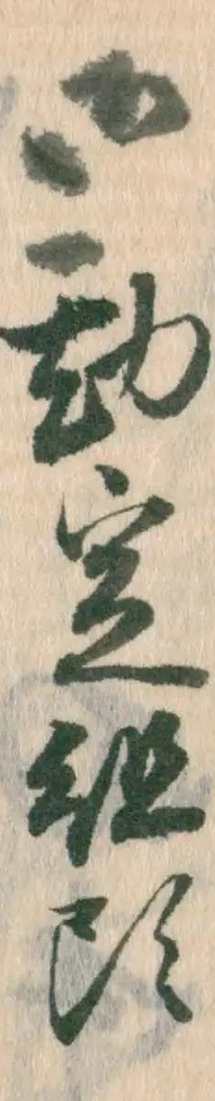御勘定組頭
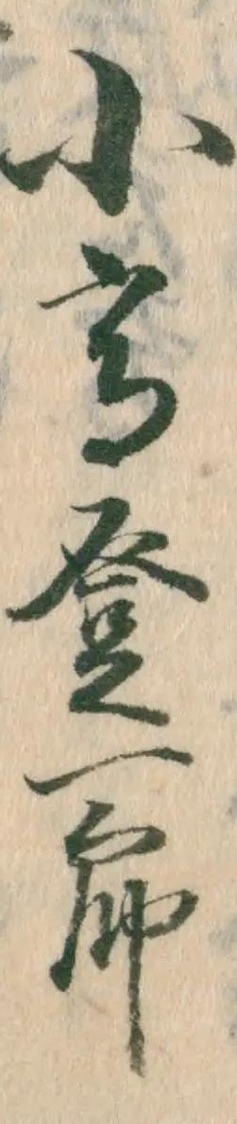小高登一郎
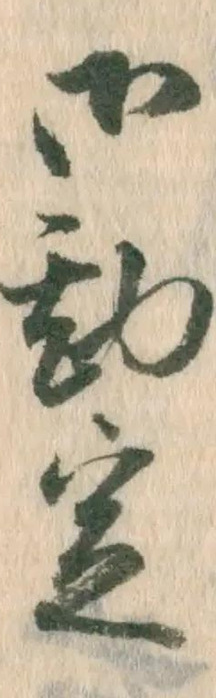御勘定

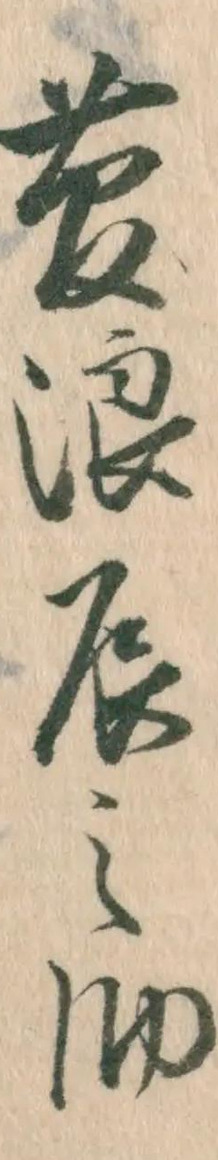菅浪辰之助
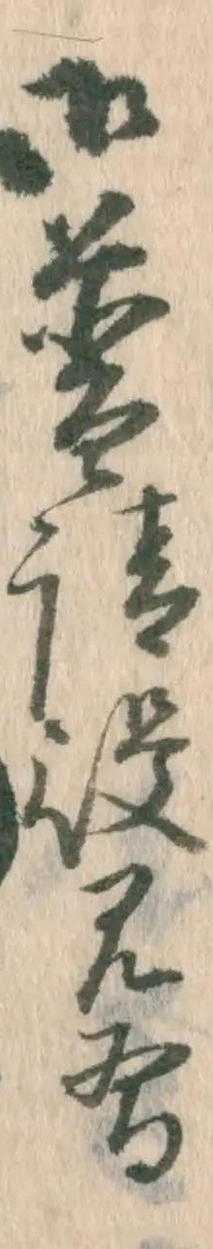御普請役見習
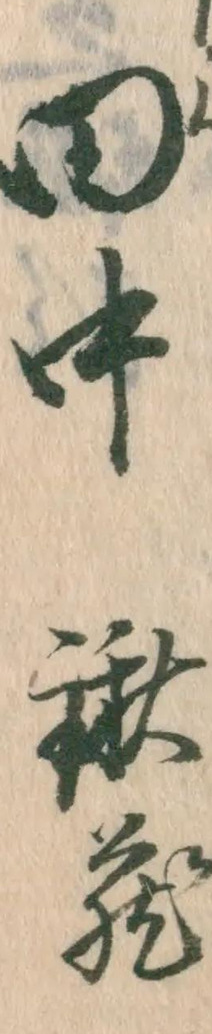田中鍬蔵
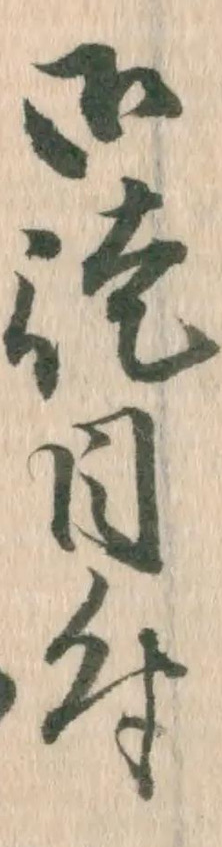御徒目付
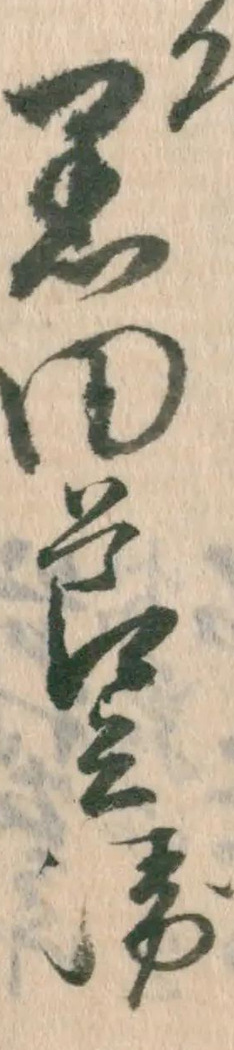黒田節兵衛
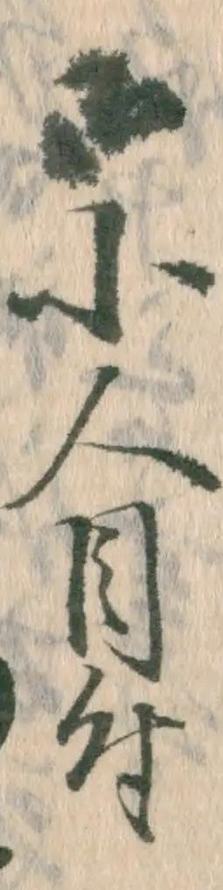御小人目付
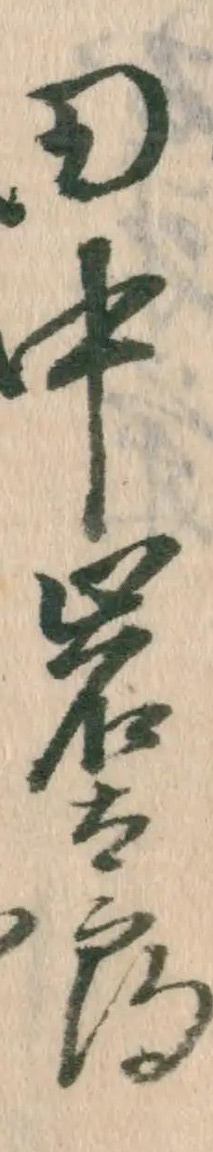田中岩太郎
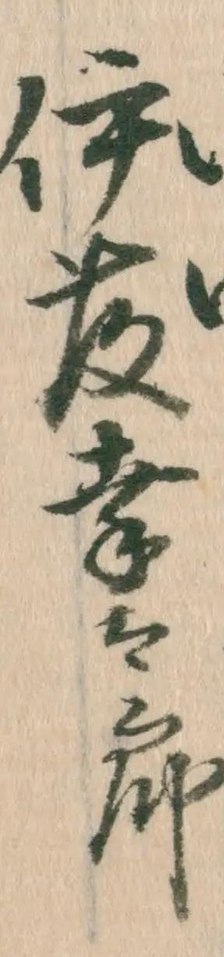伊藤幸太郎
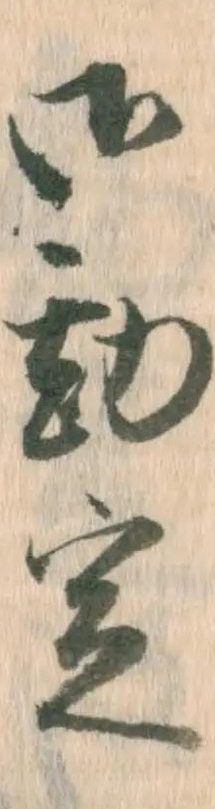御勘定
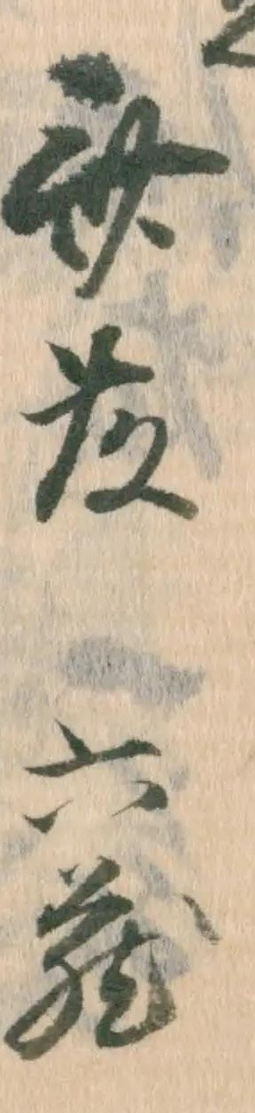斎藤六蔵
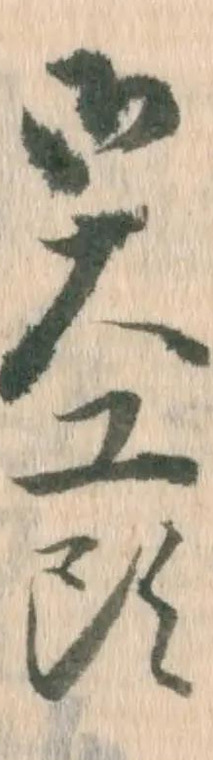御大工頭
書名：七十冊物類集 71巻. [44] 四十三 牢屋敷御普請御修覆地震ニ付骨折候牢屋掛御褒美之部
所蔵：国立国会図書館 National Diet Library, JAPAN
